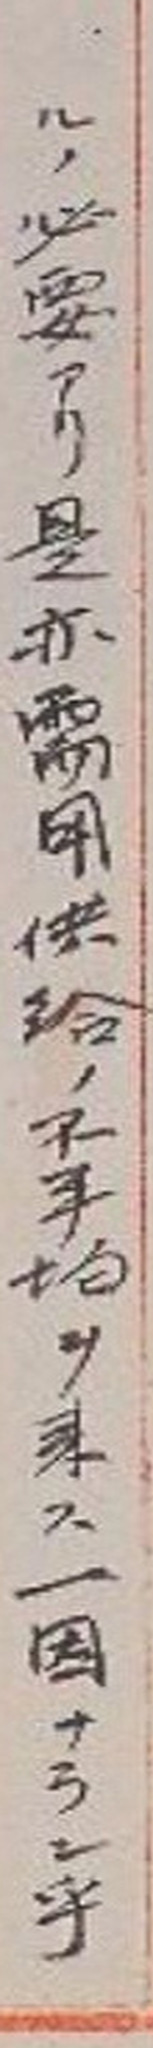ルノ必要アリ是亦需用供給ノ不平均ヲ来ス一因ナラン乎
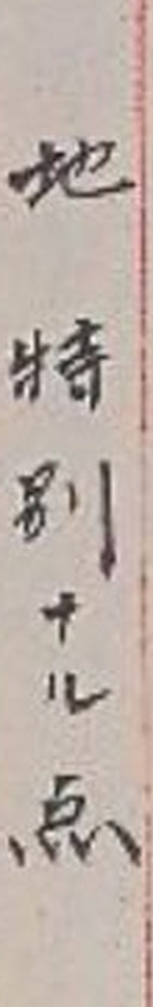地特別ナル点
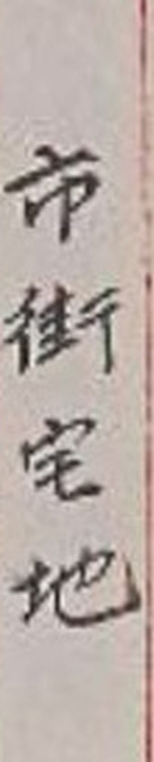市街宅地
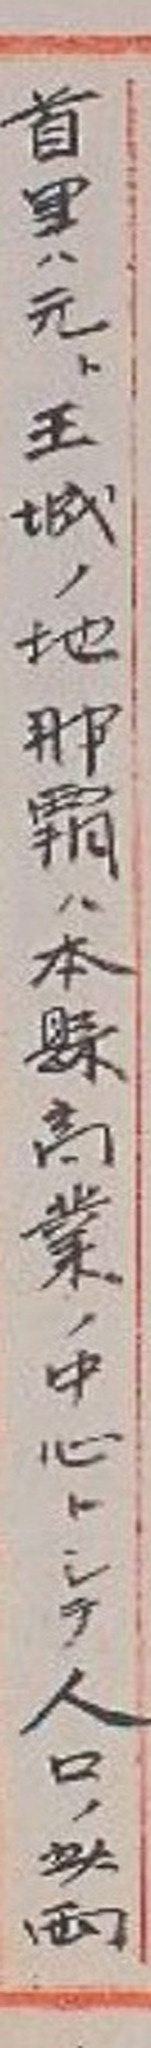首里ハ元ト王城ノ地那覇ハ本県商業ノ中心トシテ人口ノ此両
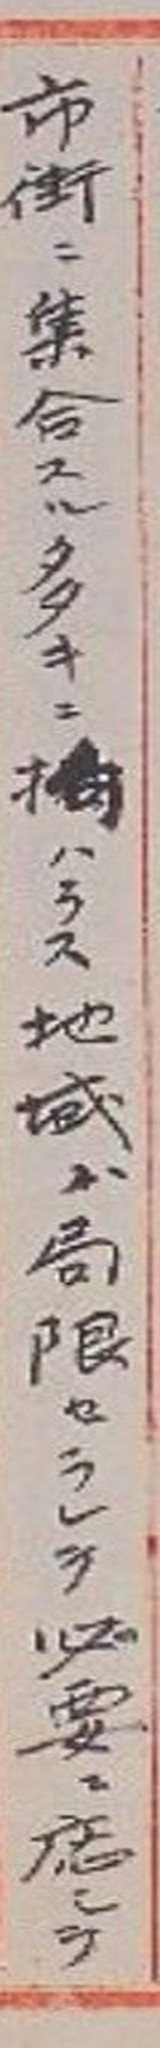市街ニ集合スル多キニ拘ハラス地域ハ局限セラレテ必要ニ応シテ

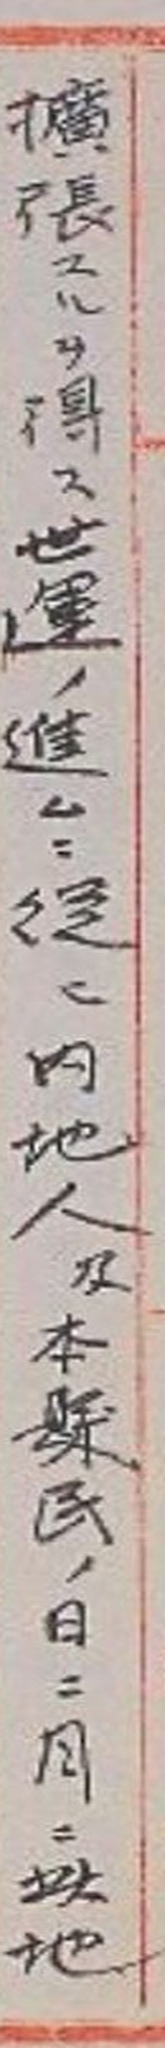拡張スルヲ得ス世運ノ進ムニ従ヒ内地人及本県民ノ日ニ月ニ此地
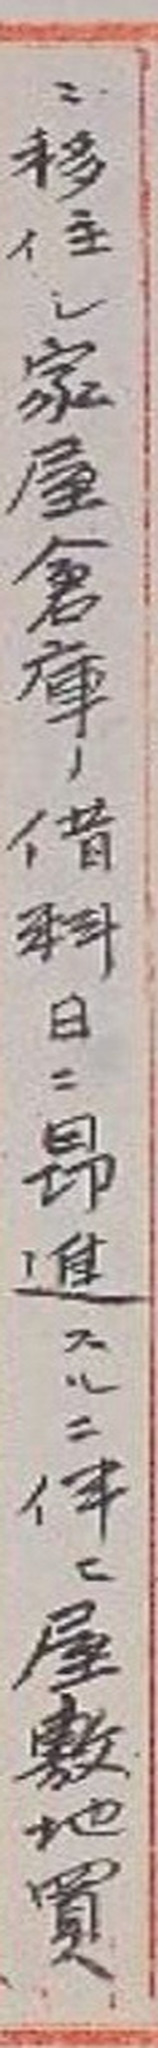ニ移住シ家屋倉庫ノ借料日ニ昂進スルニ伴ヒ屋敷地買
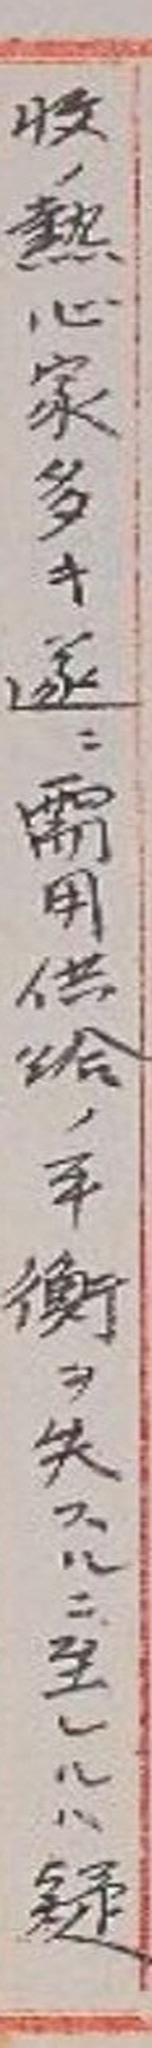収ノ熱心家多キ遂ニ需用供給ノ平衡ヲ失スルニ至レルハ疑
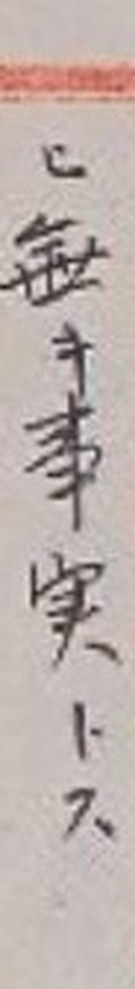ヒ無キ事実トス
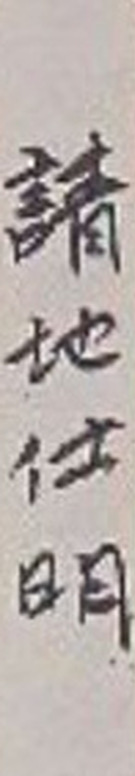請地仕明
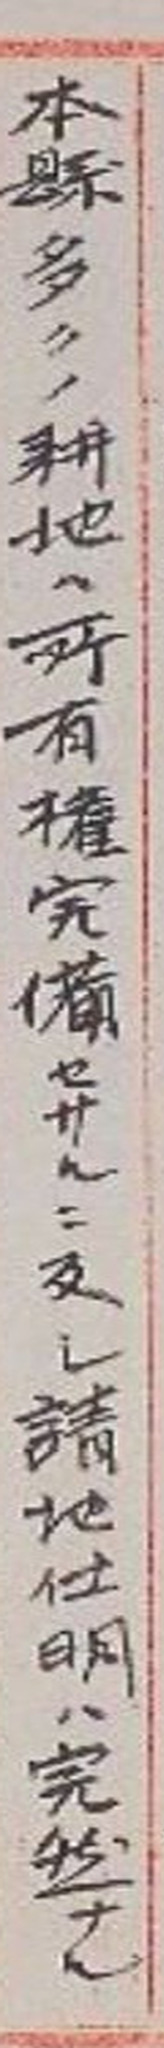本県多クノ耕地ハ所有権完備セサルニ反シ請地仕明ハ完然ナル
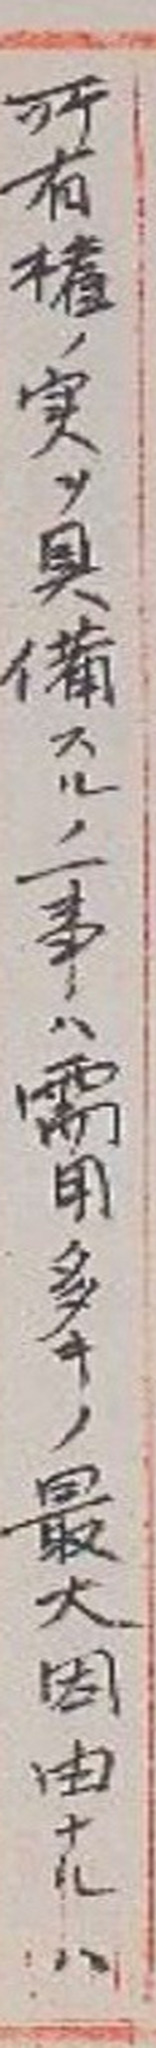所有権ノ実ヲ具備スルノ一事ハ需用多キノ最大因由ナルハ
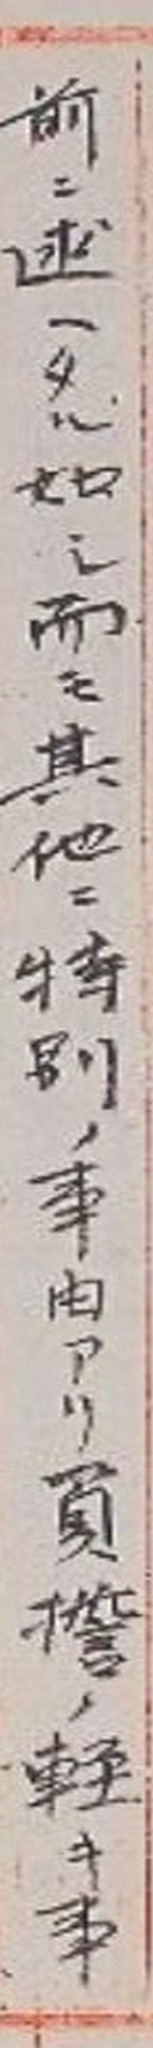前ニ述ヘタル如シ而モ其他ニ特別ノ事由アリ負担ノ軽キ事
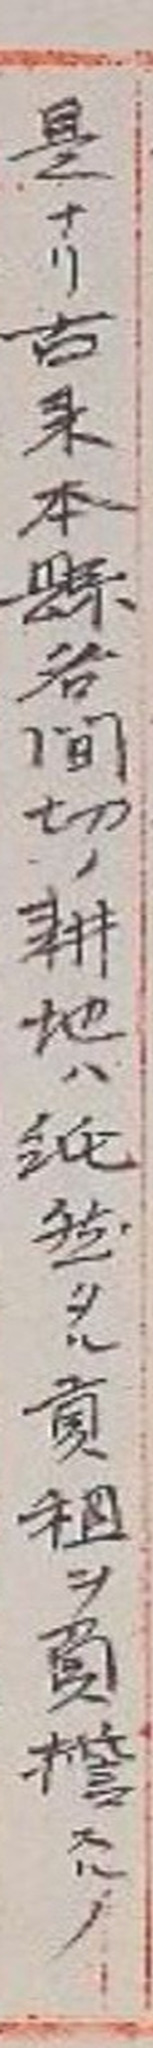是ナリ古来本県各間切ノ耕地ハ純然タル貢租ヲ負担スルノ
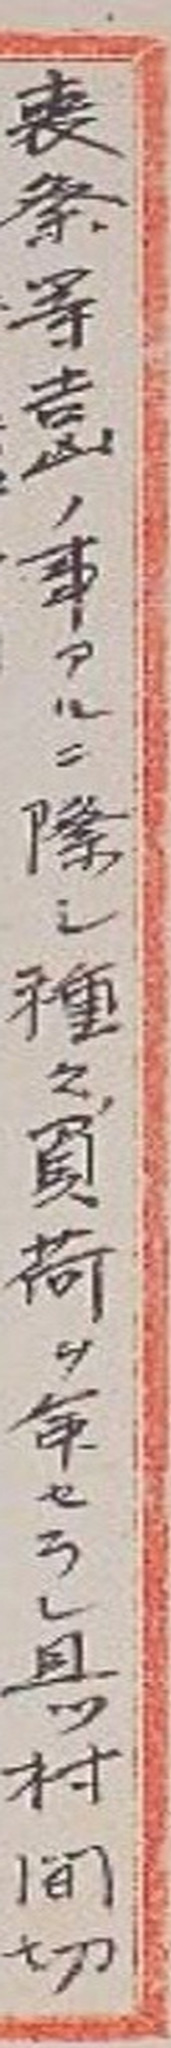喪祭等吉凶ノ事アルニ際シ種々負荷ヲ命セラレ且ツ村間切
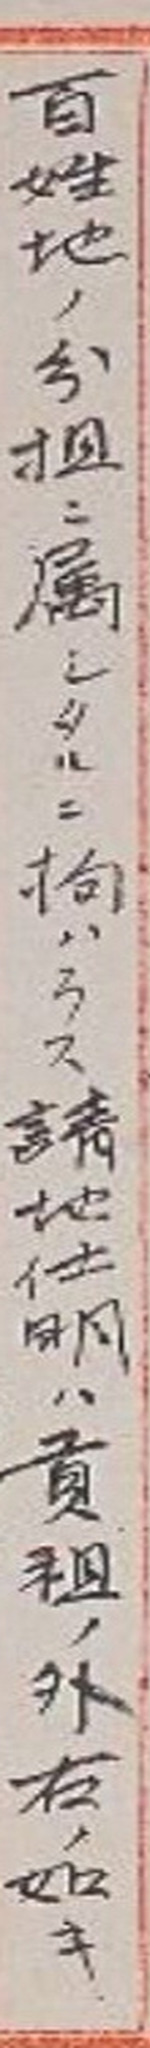百姓地ノ分担ニ属シタルニ拘ハラス請地仕明ハ貢租ノ外右ノ如キ
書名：本県地価ノ高キ理由調書
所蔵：University of the Ryukyus Library
